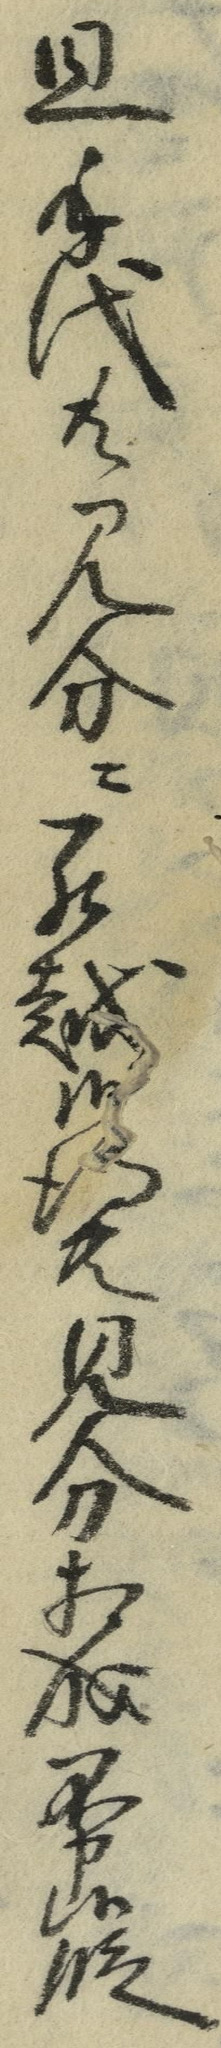且手代共見分に罷越候得共見分相成不申候段
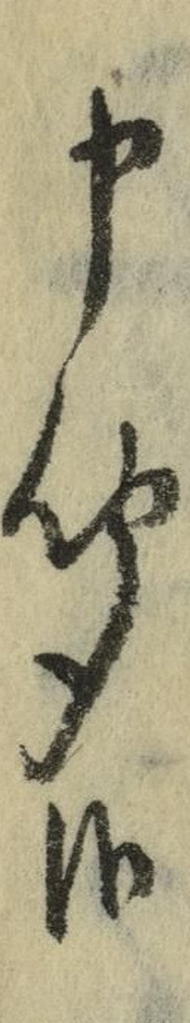申聞候
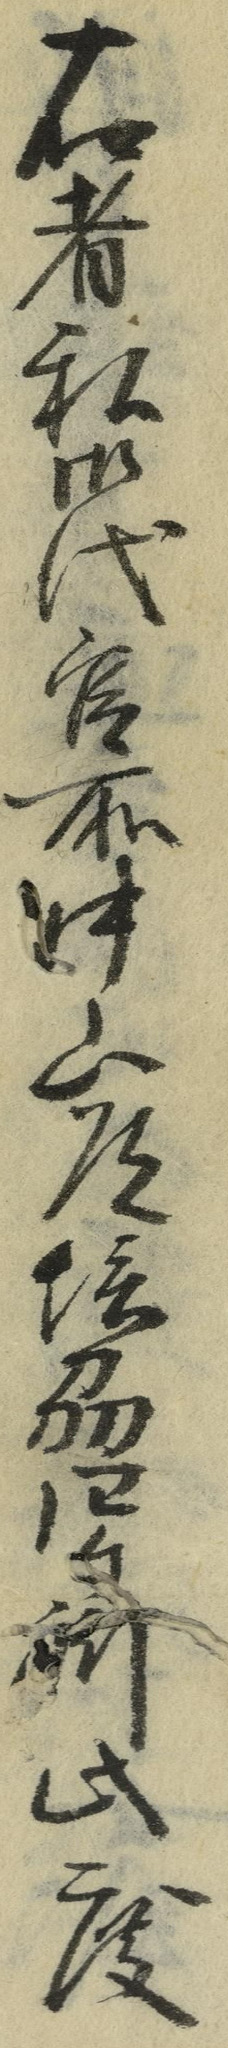右は私御代官所中山道信州四ケ所此度
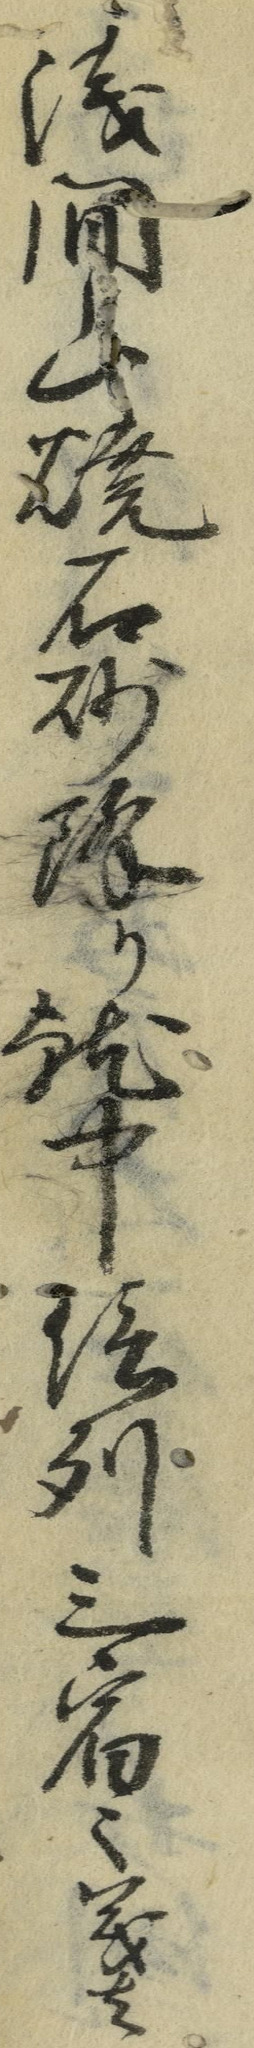浅間山焼石砂降り就中信州三宿之義者
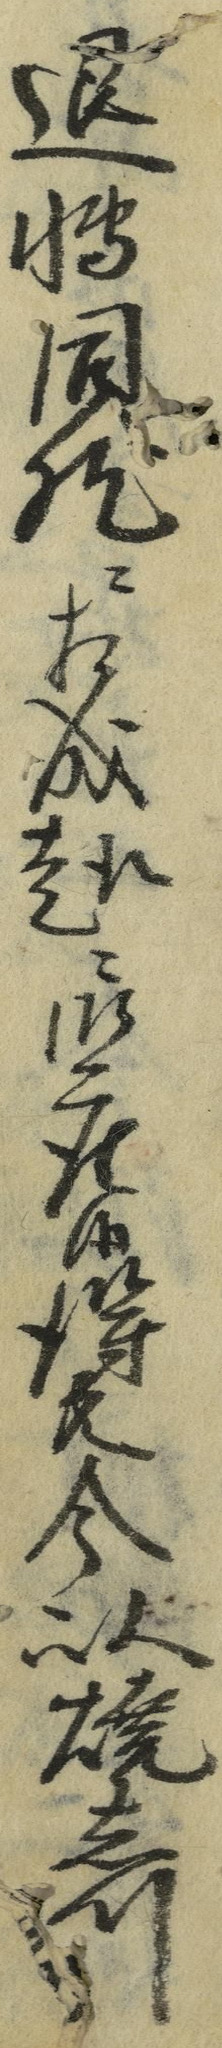退転同然に相成趣に御座候得共今以焼しつ
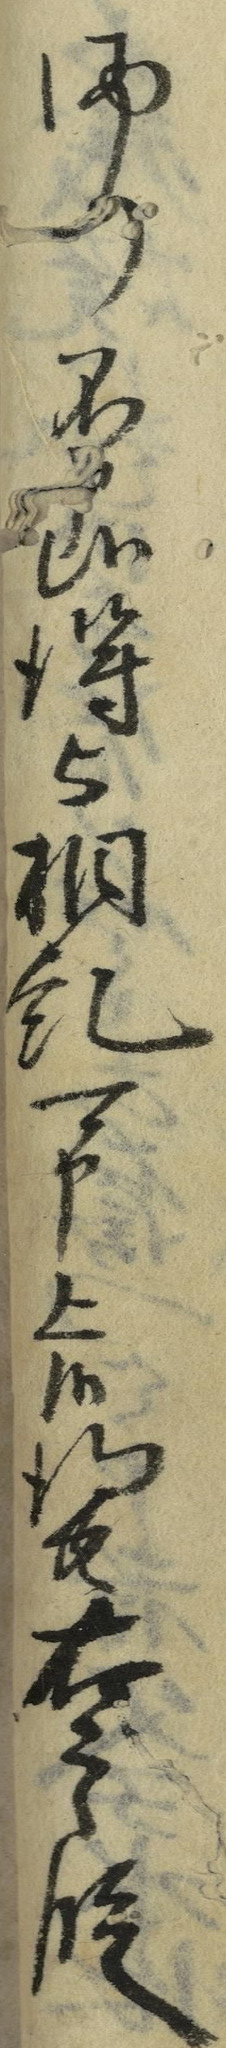まり不申候得と相糺可申上候得共右之段
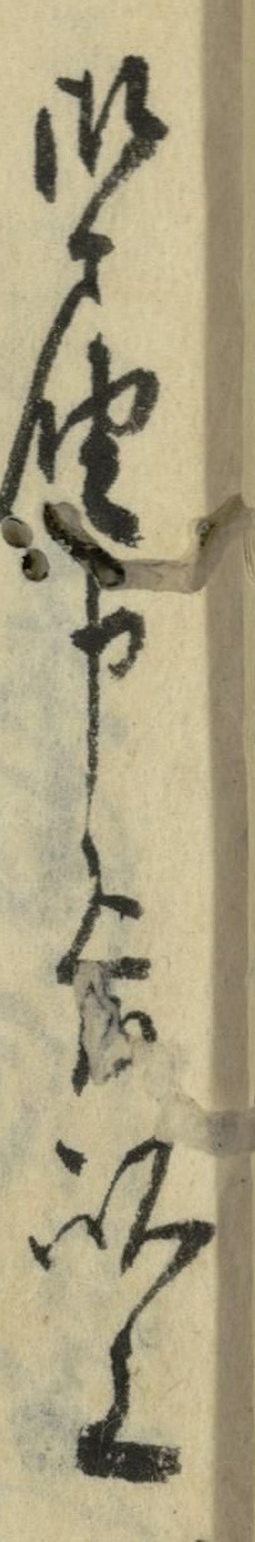御届申上候以上
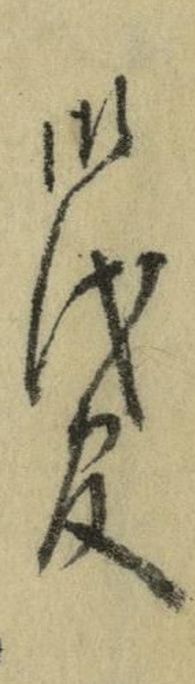御代官
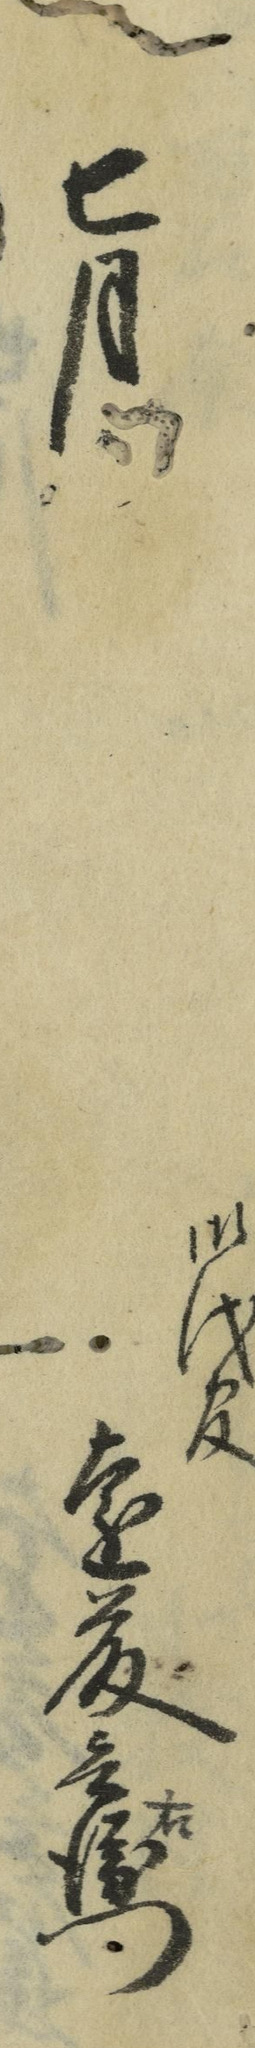七月遠藤兵右衛門
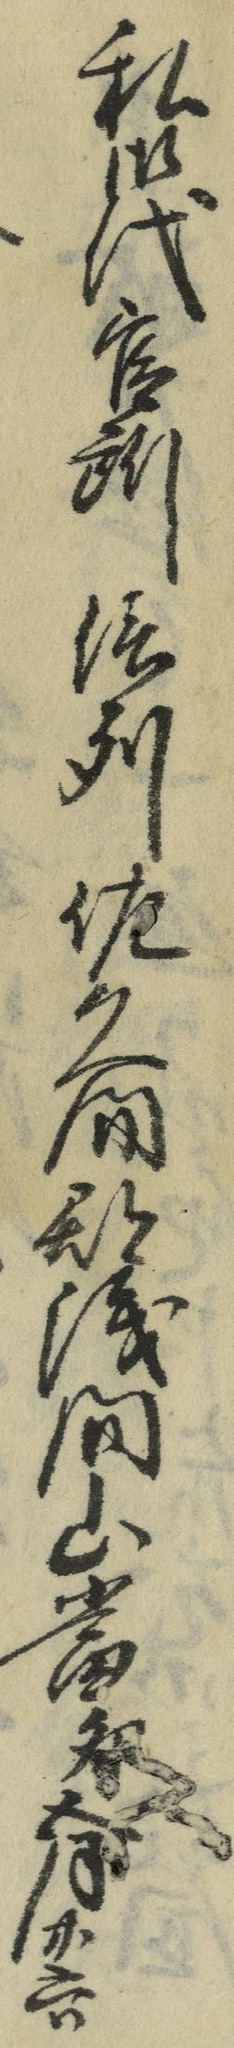私御代官所信州佐久間郡浅間山当卯五月廿六日
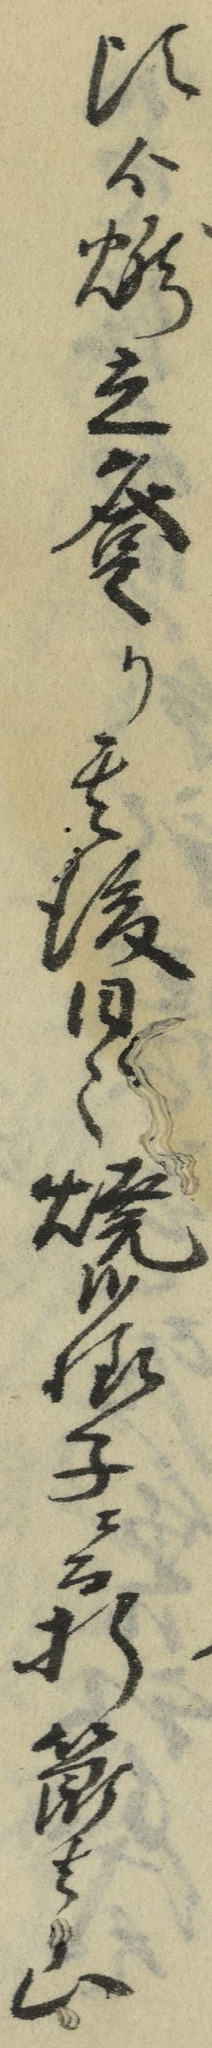頃ゟ燃立登り其後日々焼候様子に而折節も山
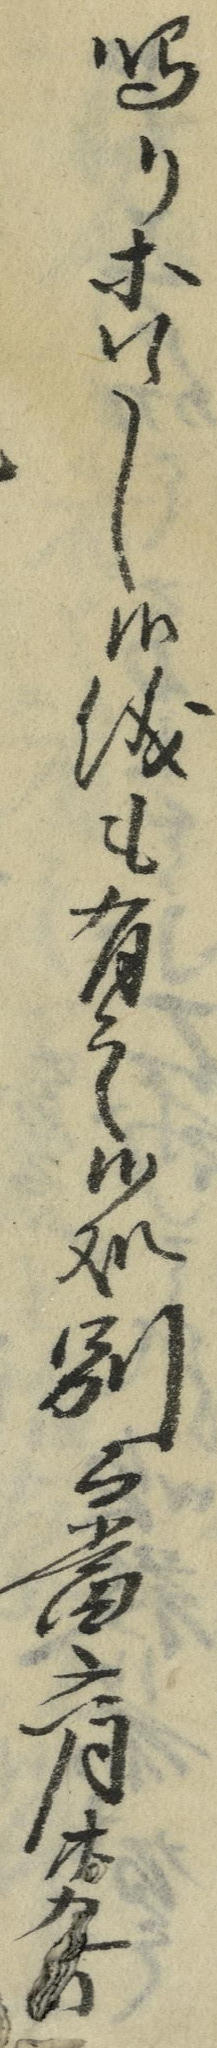鳴り等いたし候儀も有之候処別而当六月廿九日
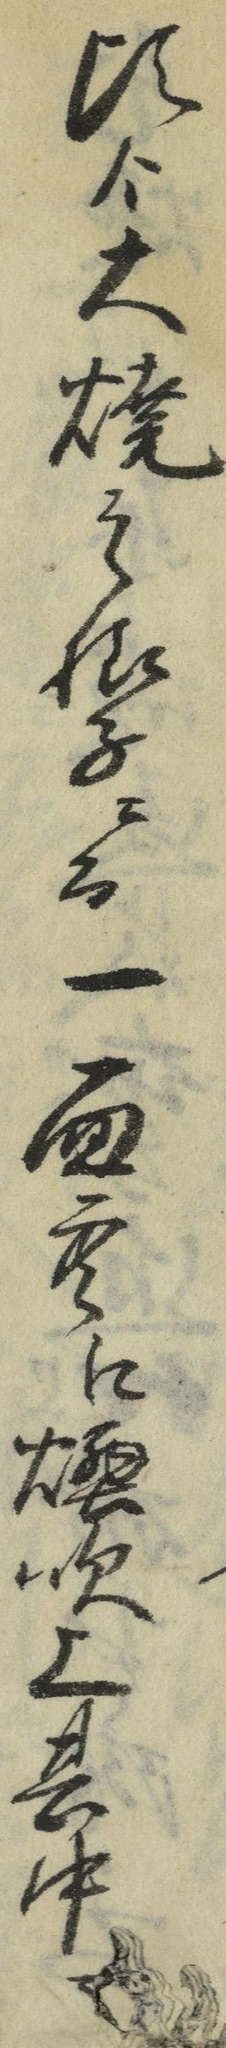頃ゟ大焼之様子に而一面空江煙吹上其中
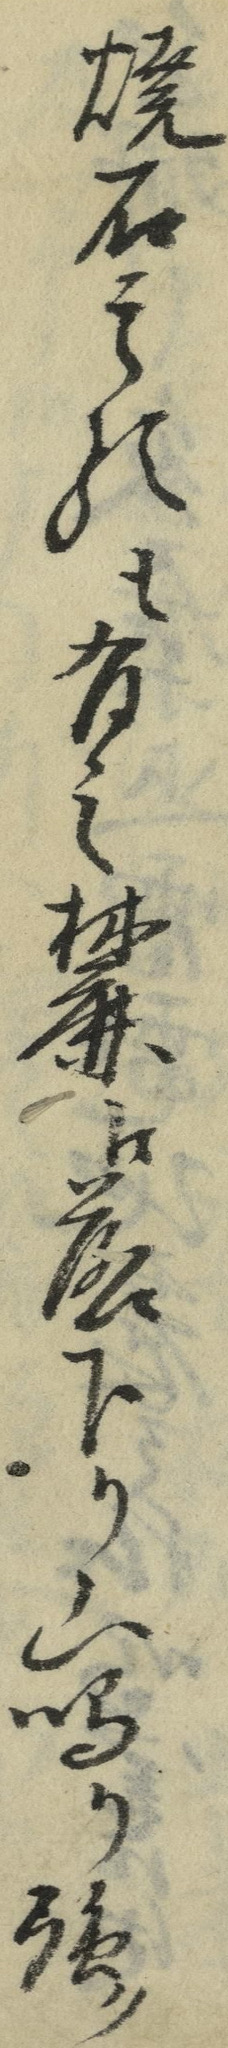焼石之類も有之麓江落下り山鳴り強ク

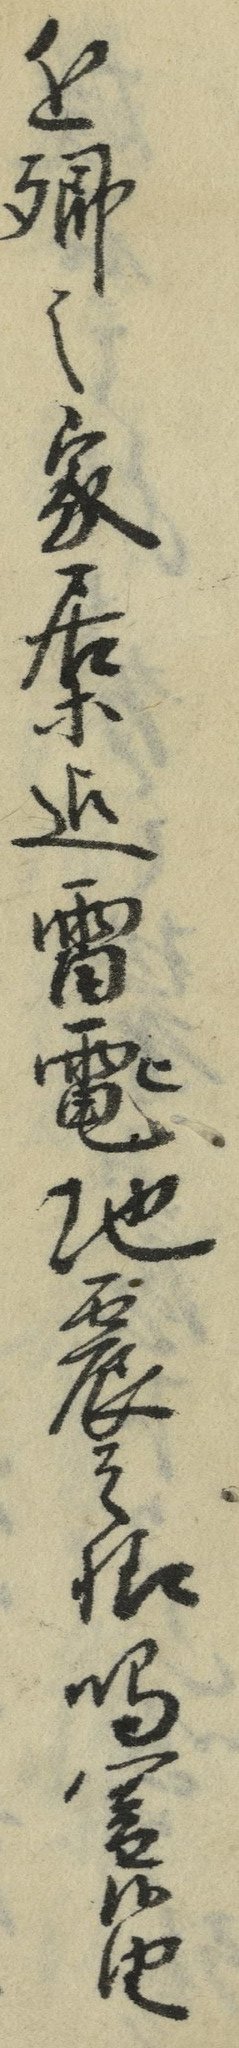近郷之家居等迄雷電地震之様鳴響候由
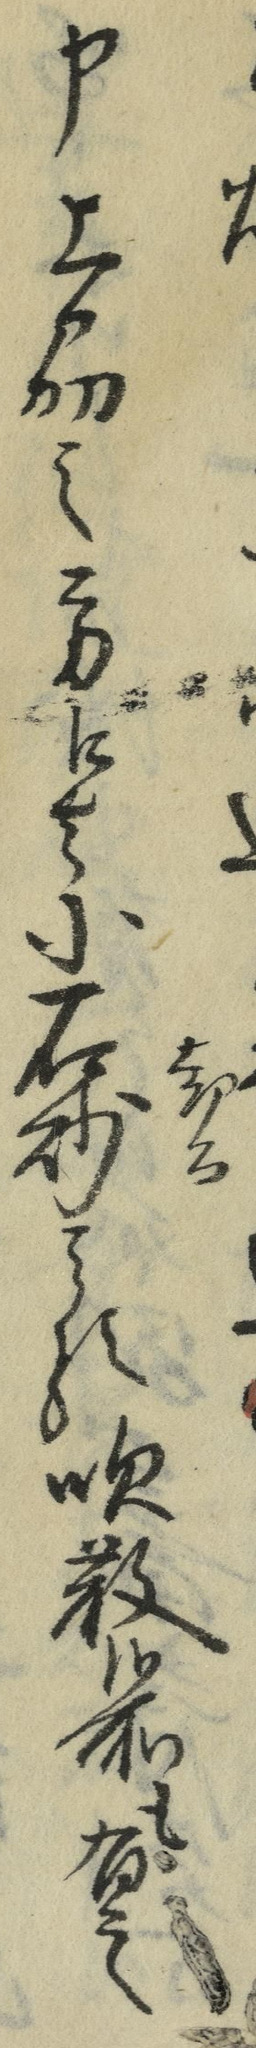申上州之方江は小石砂之類吹散候所も有之
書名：天明三卯年七月　浅間山焼注進写
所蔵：東京大学地震研究所図書室 Earthquake Research Institute Library, The University of Tokyo, JAPAN
